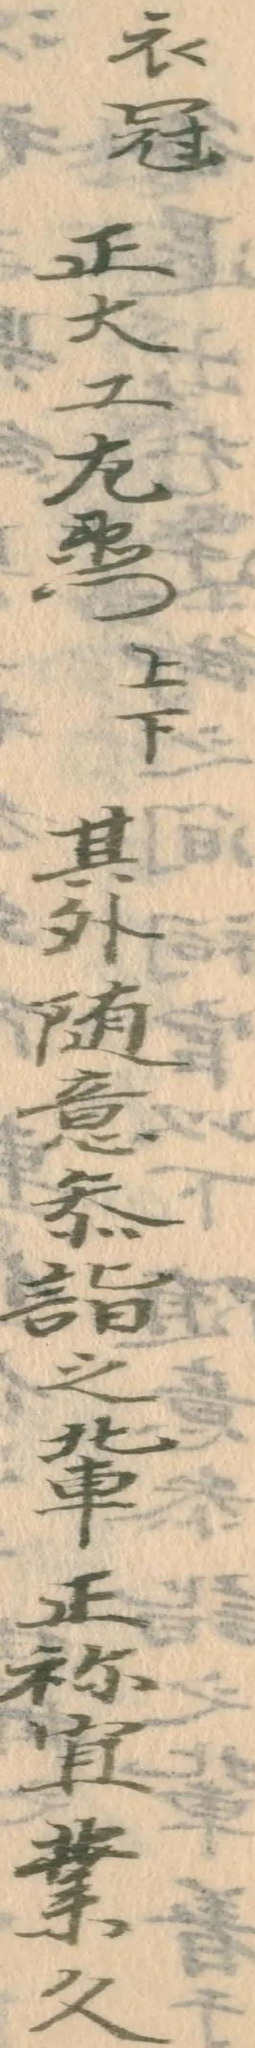衣冠正大工左衛門上下其外随意参詣之輩正祢宜業久
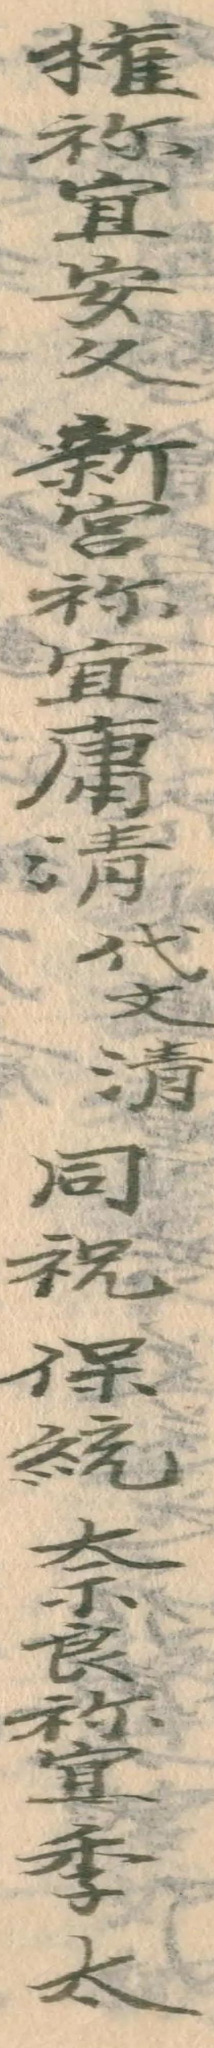権祢宜安久新宮祢宜庸清代文清同祝保統奈良祢宜季太
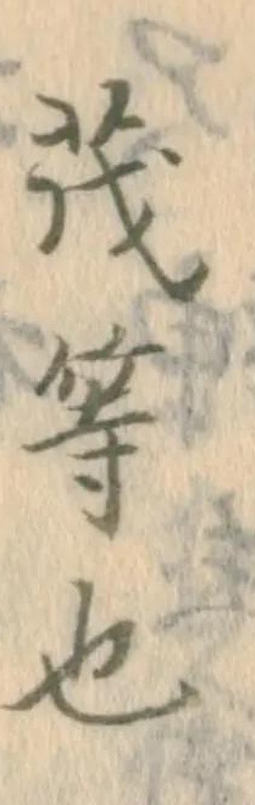茂等也
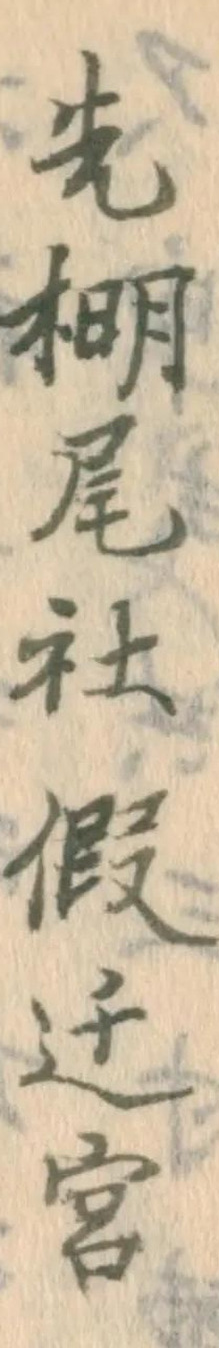先棚尾社仮迁宮
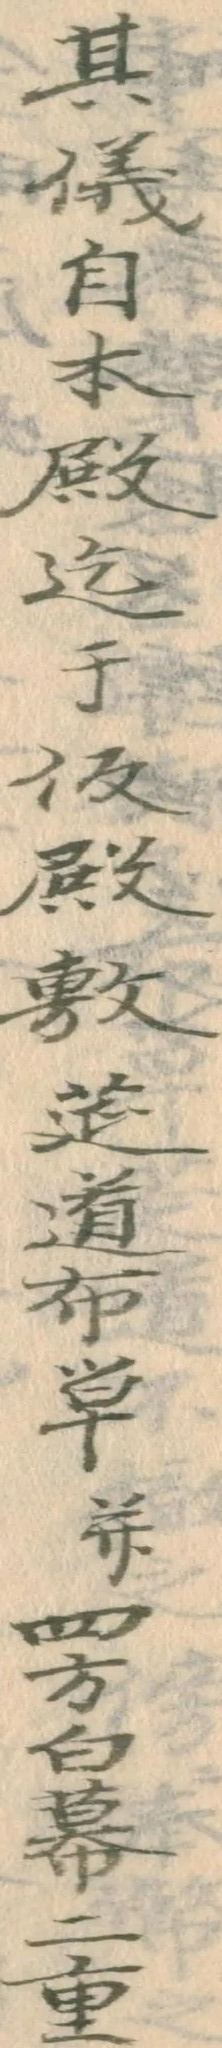其儀自本殿迄于仮殿敷筵道布単并四方白幕二重
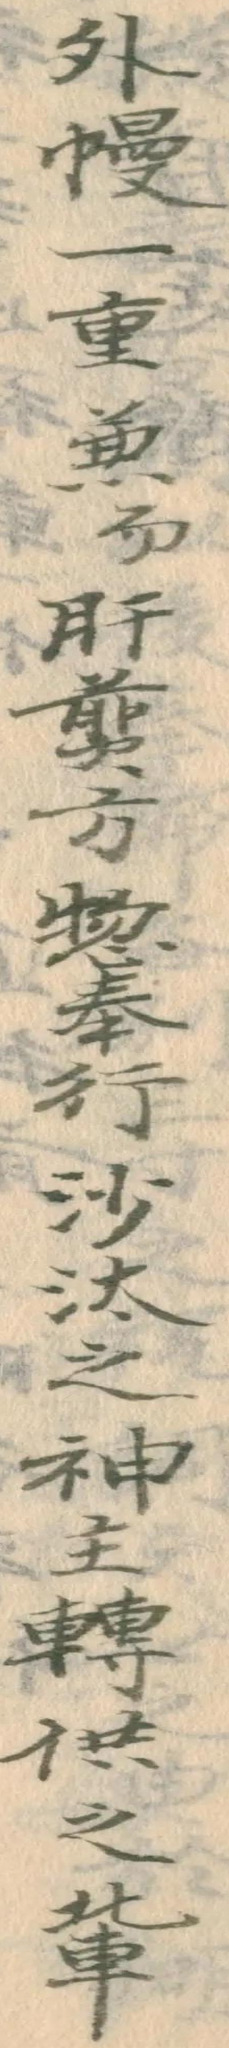外幔一重兼而肝煎方惣奉行沙汰之神主転供之輩
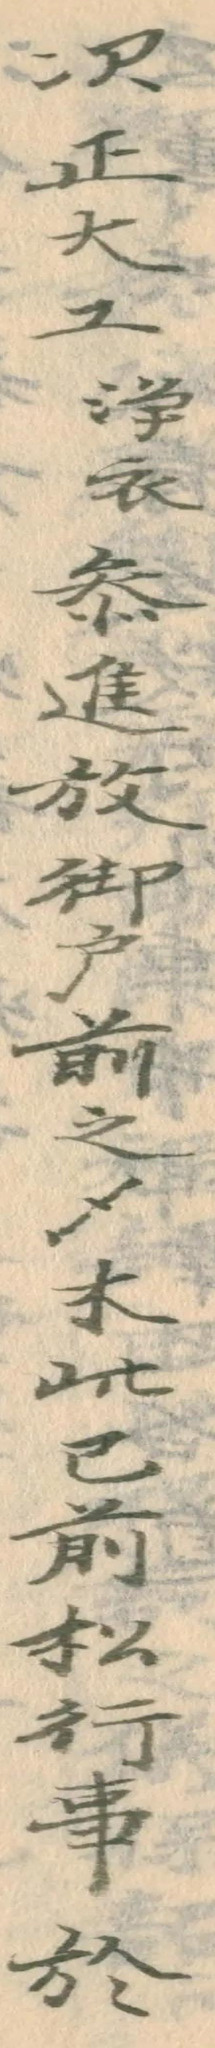次正大工浄衣参進放御戸前之〆木此已前松行事於
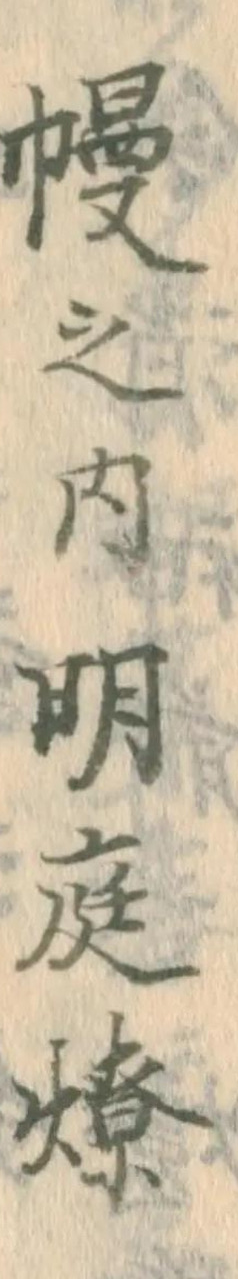幔之内明庭燎
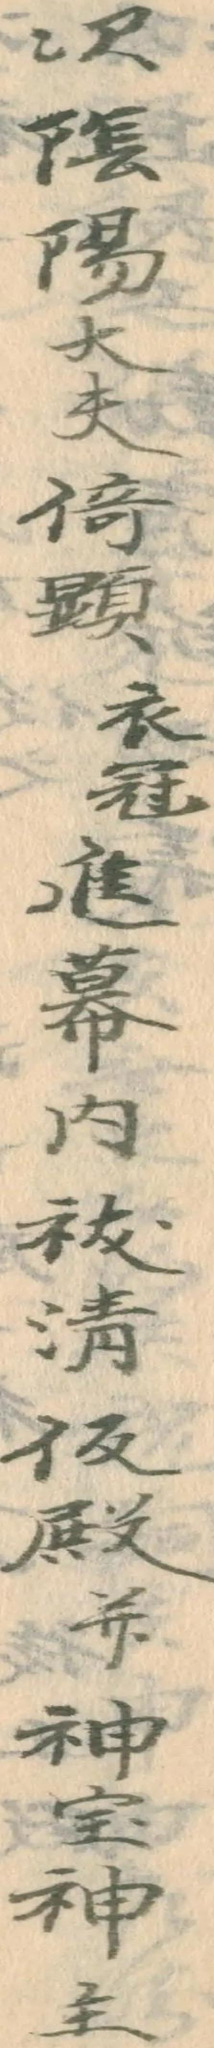次陰陽大夫倚顕衣冠進幕内祓清仮殿并神宝神主
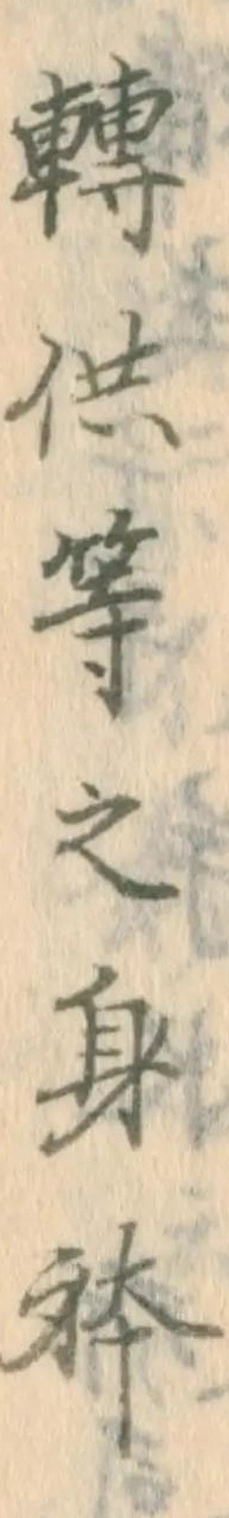転供等之身体

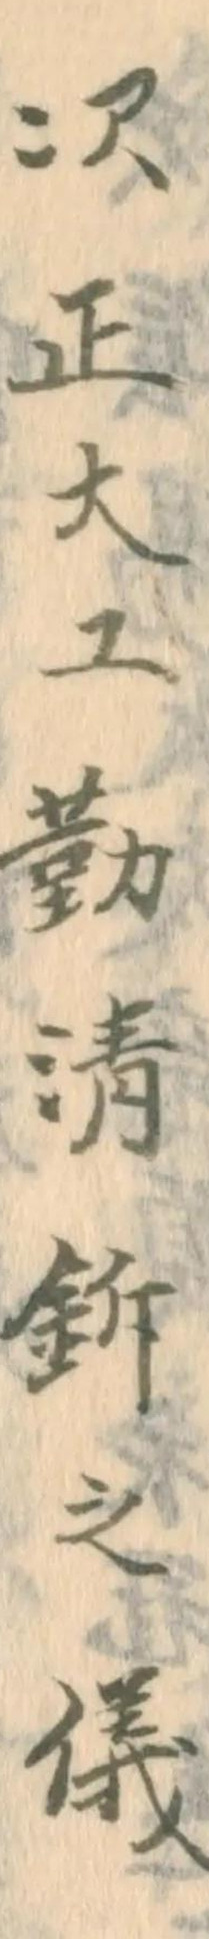次正大工勤釿之儀
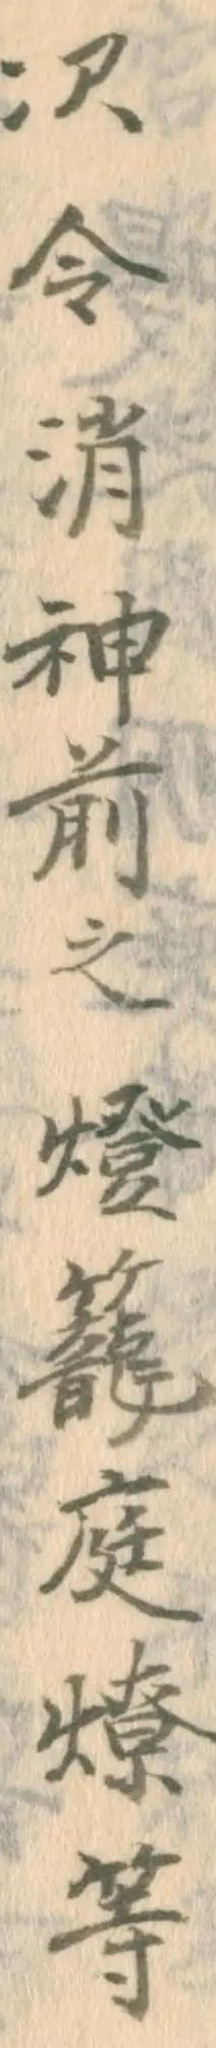次令消神前之燈籠庭燎等
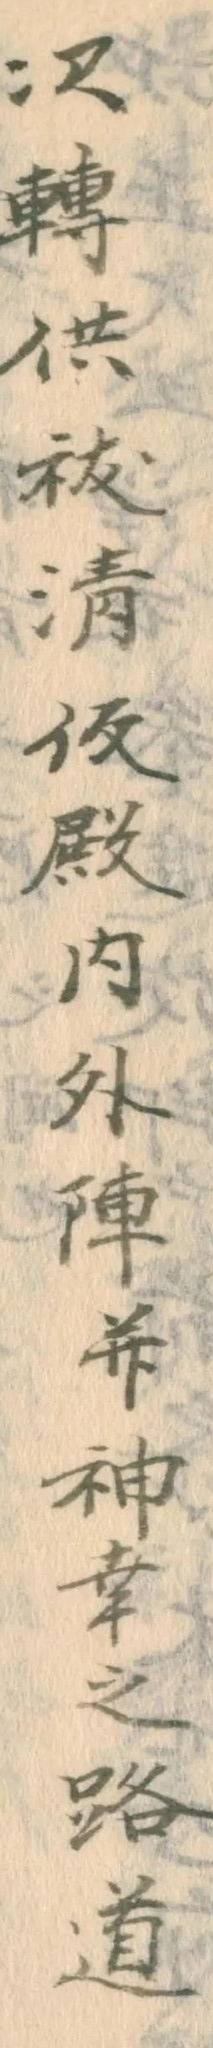次転供祓清仮殿内外陣并神幸之路道
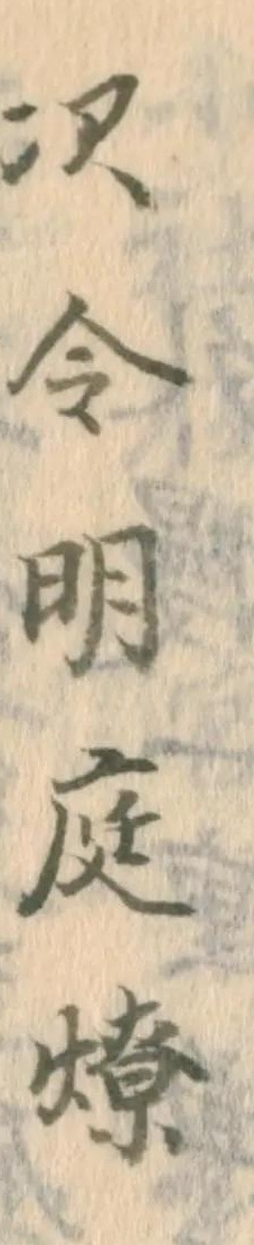次令明庭燎
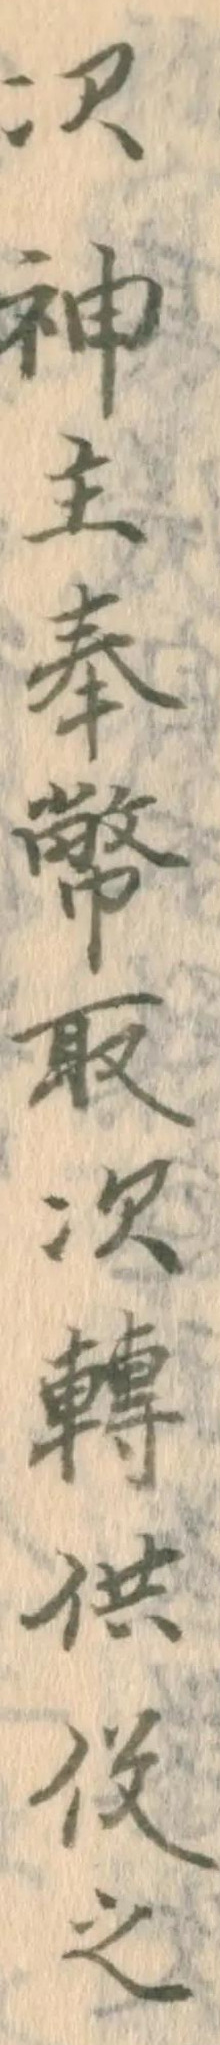次神主奉幣取次転供役之
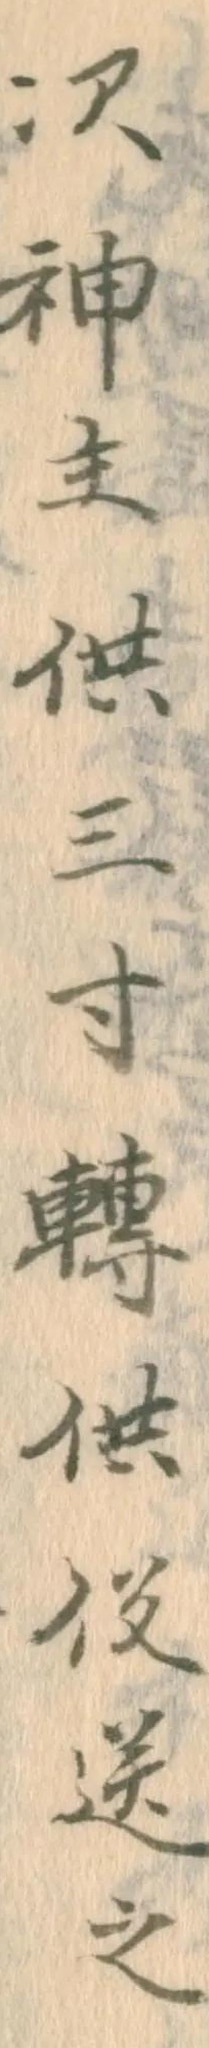次神主供三寸転供役送之
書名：賀茂社記録. 第17冊
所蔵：国立国会図書館 National Diet Library, JAPAN
